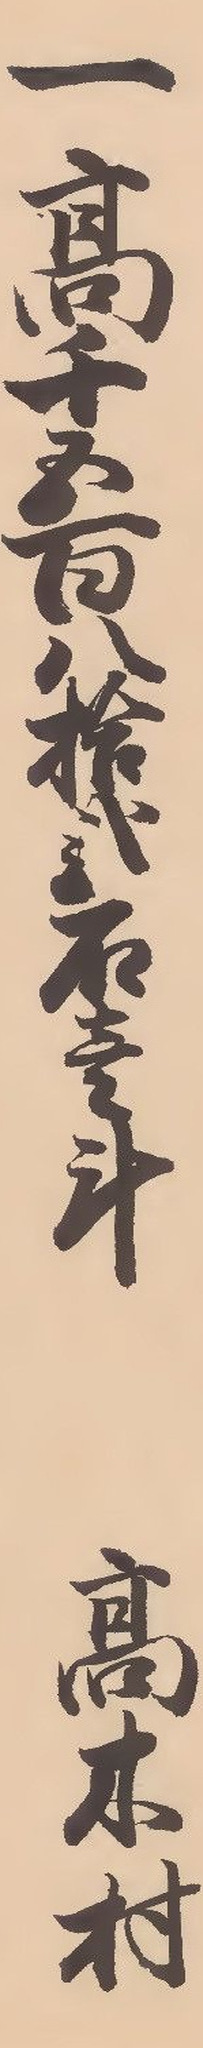一高千五百八拾弐石壱斗高木村
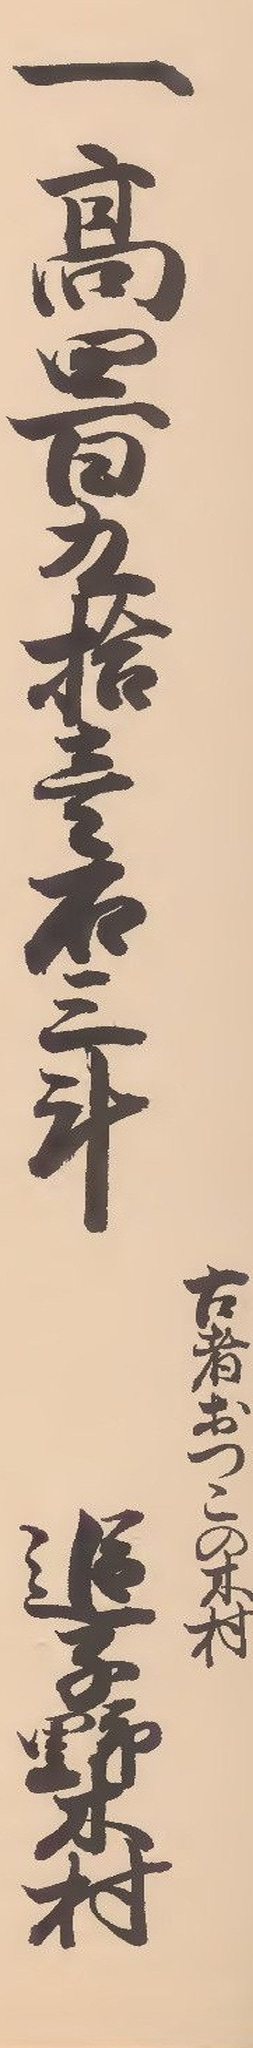一高四百九拾壱石三斗追子野木村
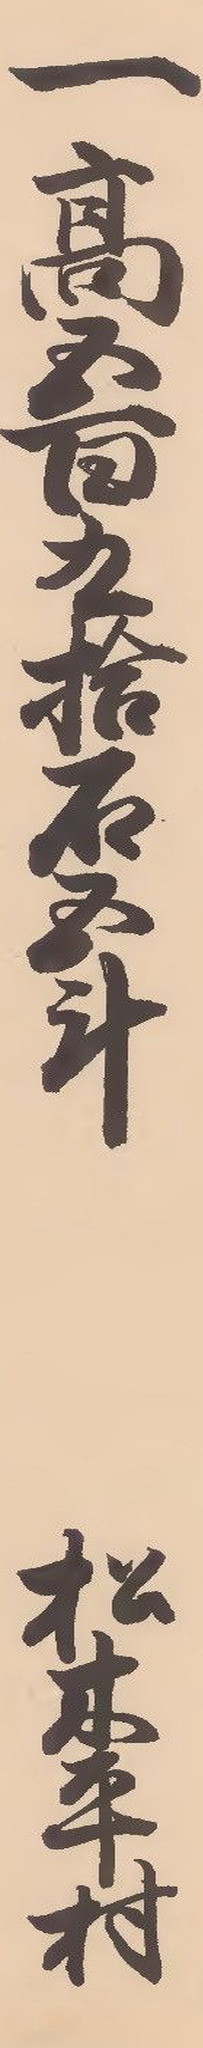一高五百九拾石五斗松木平村
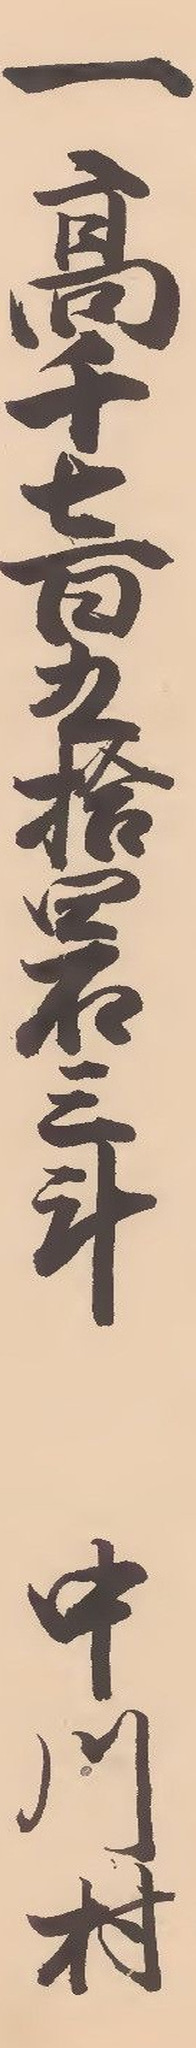一高千七百九拾四石三斗中川村
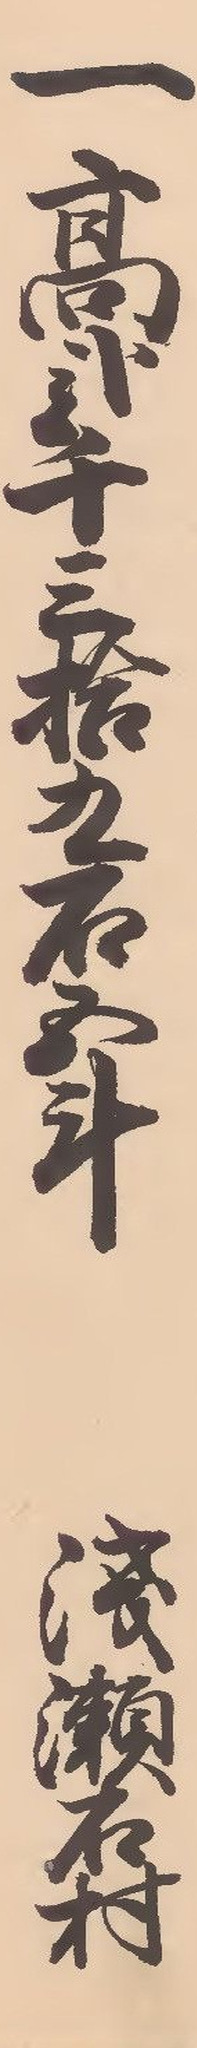一高弐千三拾九石五斗浅瀬石村

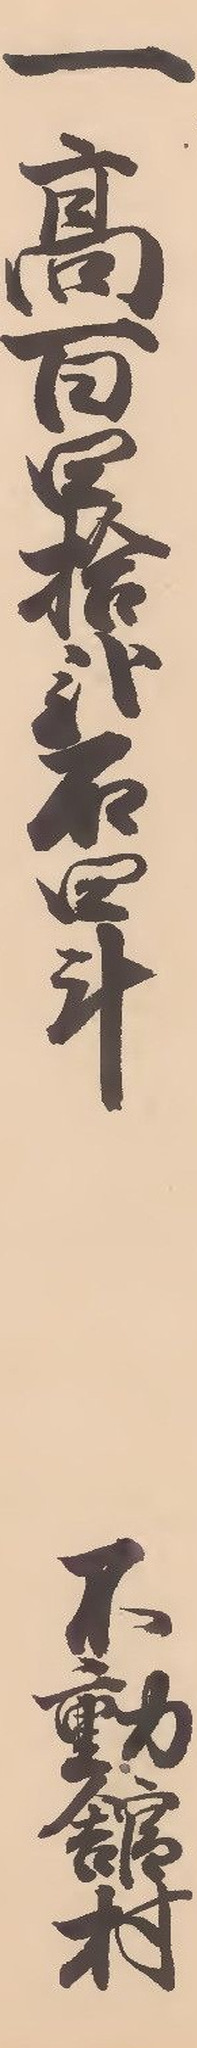一高百四拾弐石四斗不動館村
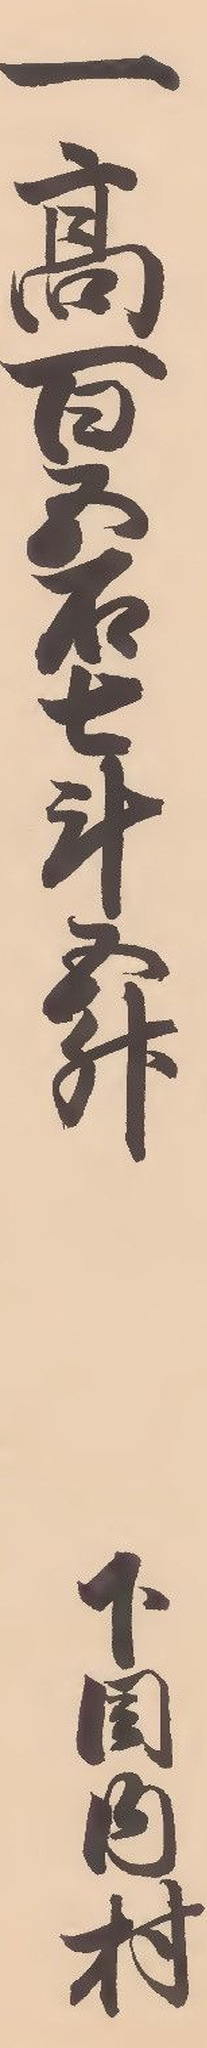一高百五石七斗五升下目内村
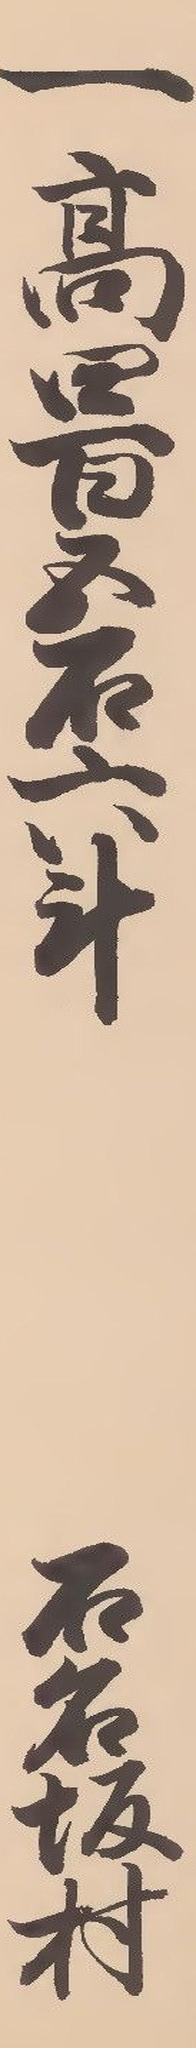一高四百五石六斗石名坂村
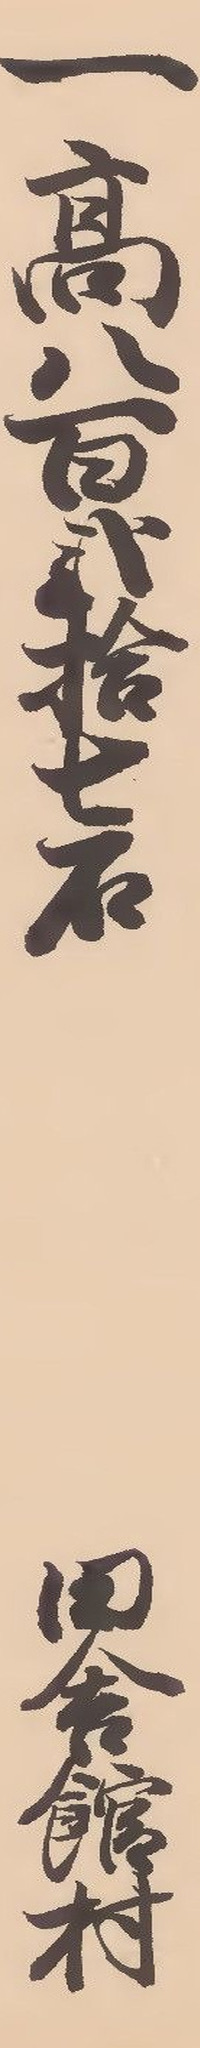一高八百弐拾七石田舎舘村
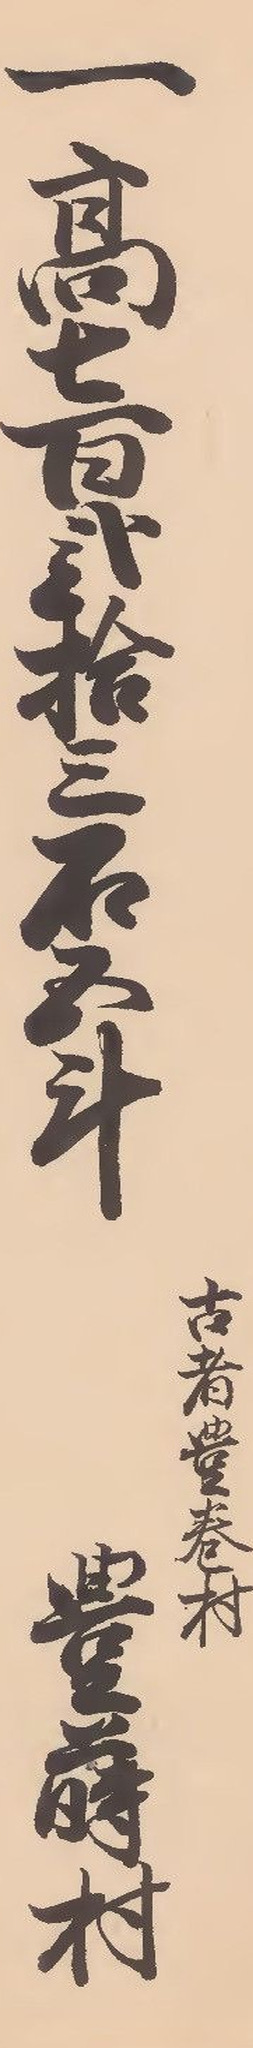一高七百弐拾三石五斗豊蒔村

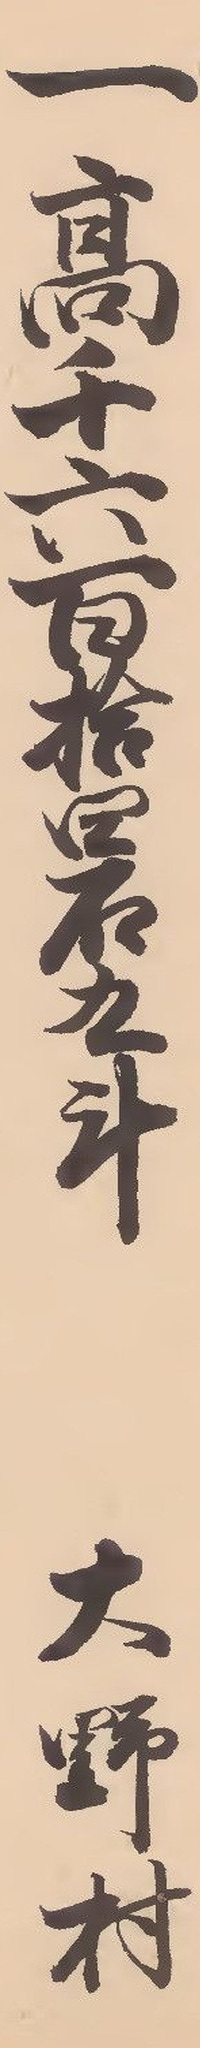一高千六百拾四石九斗大野村
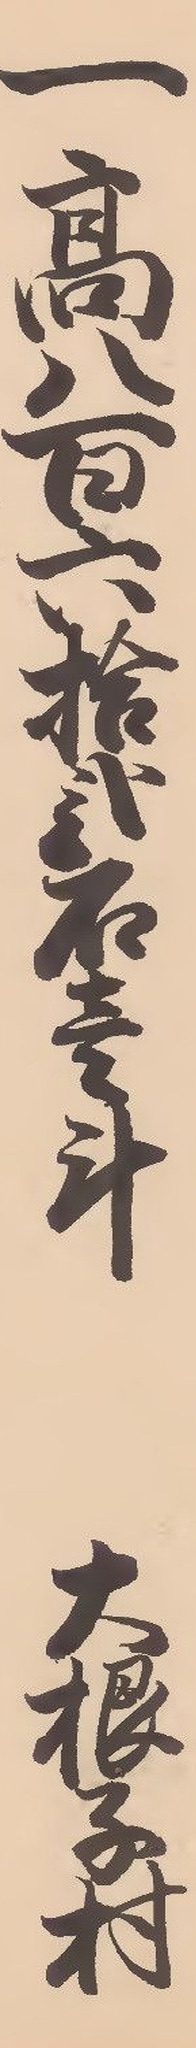一高八百六拾弐石壱斗大根子村
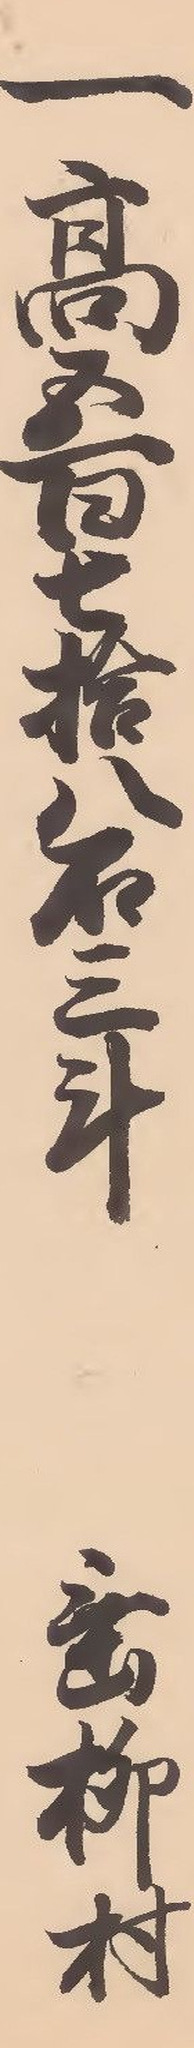一高五百七拾八石三斗垂柳村
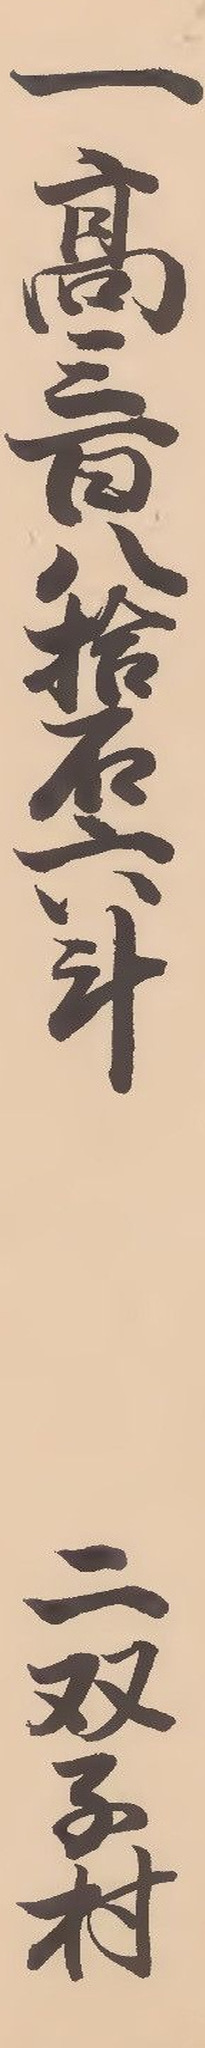一高三百八拾石六斗二双子村
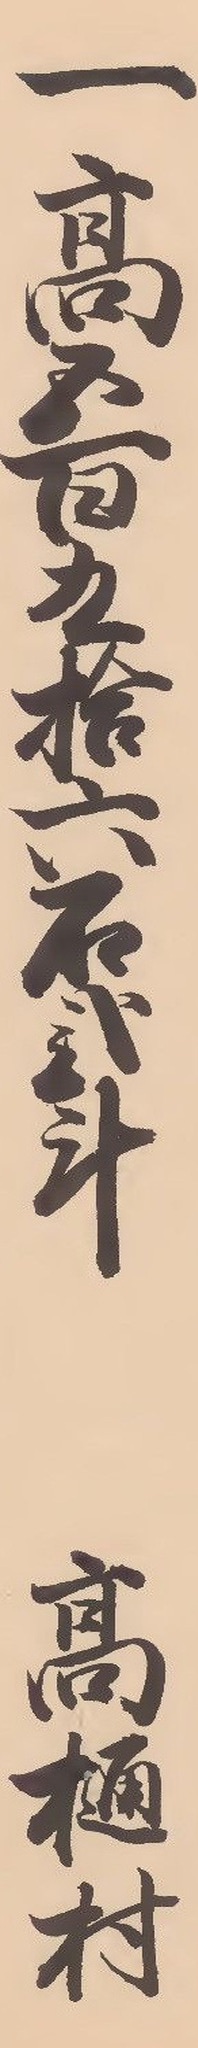一高五百九拾六石弐斗高樋村
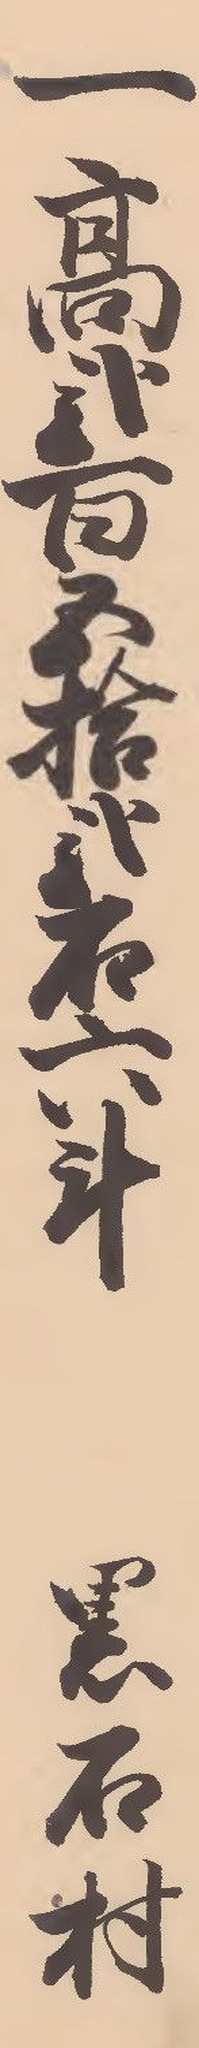一高弐百五拾弐石六斗黒石村
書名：陸奥国郷帳　７
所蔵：国立公文書館 National Archives of Japan
